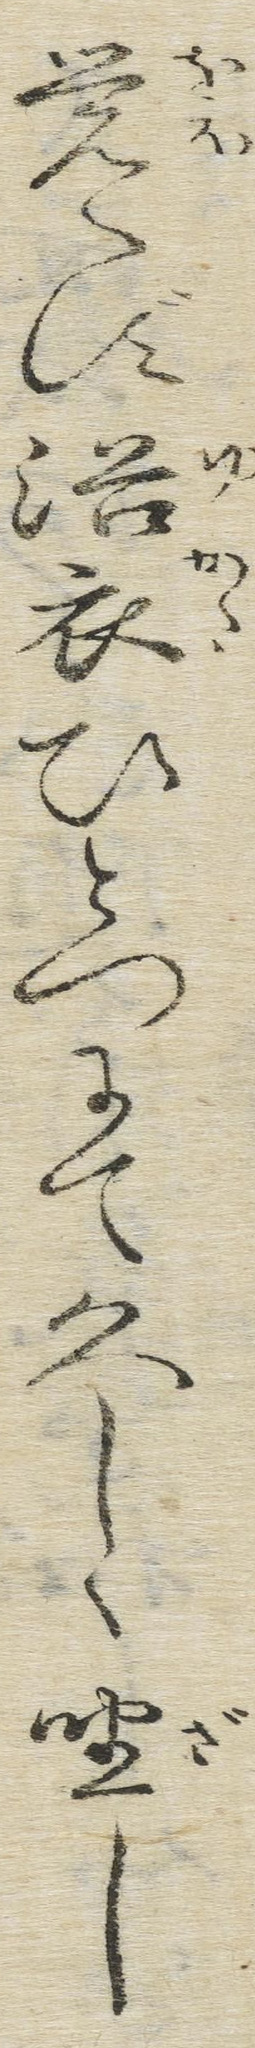覚えず浴衣ひとつにて久しく坐し
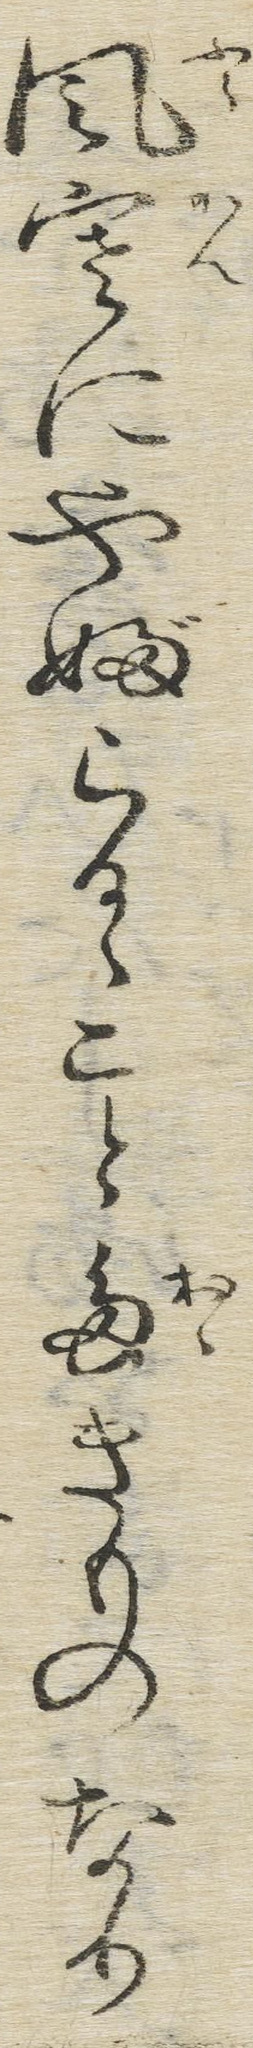風寒にやぶらるゝこと多きものなり
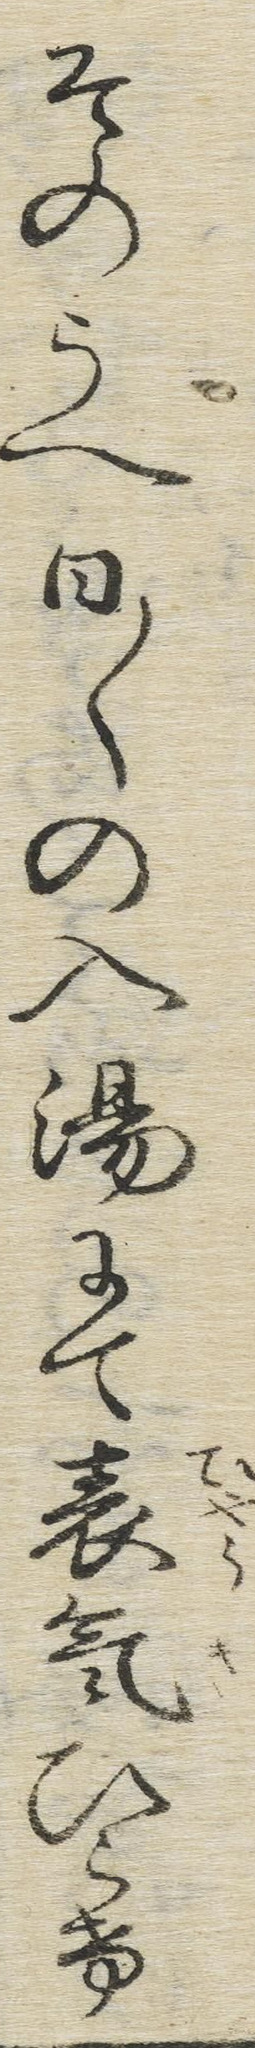そのうへ日〳〵の入湯にて表気ひらけ
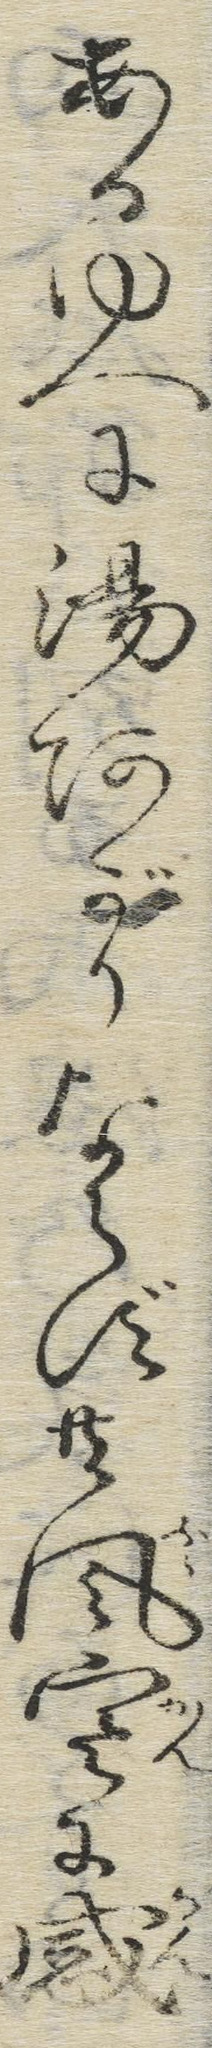あるゆへに湯あがりならず共風寒に感
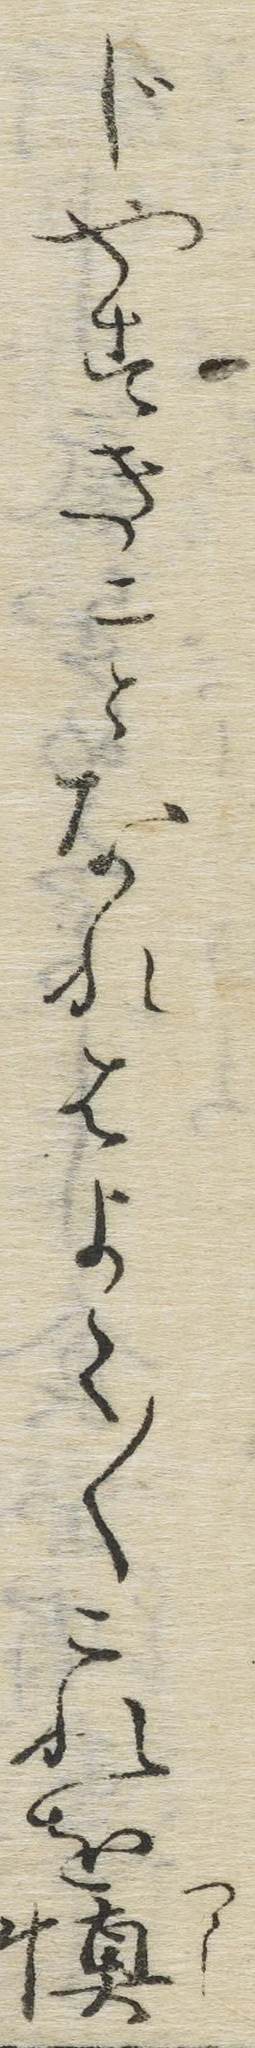じやすきことなれはよく〳〵これを慎
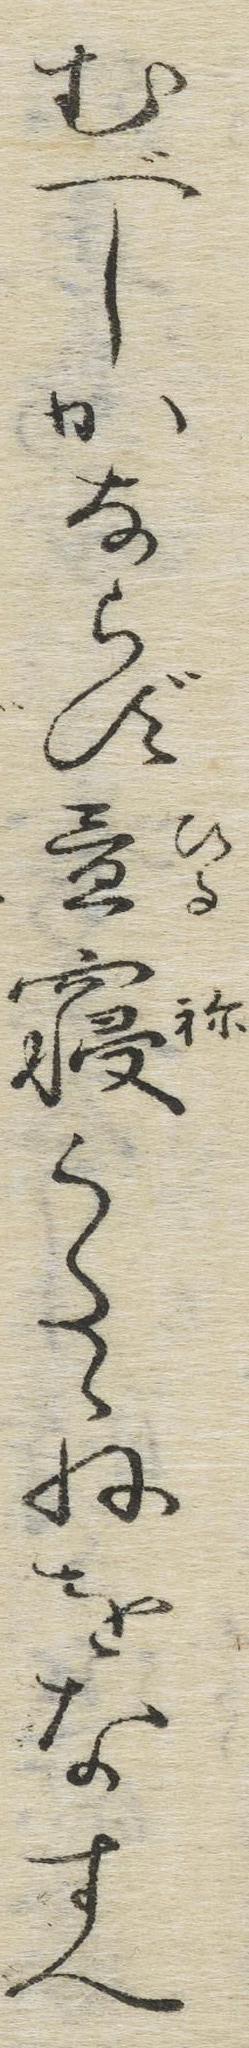むべしかならず昼寝うたゝねをなすへ
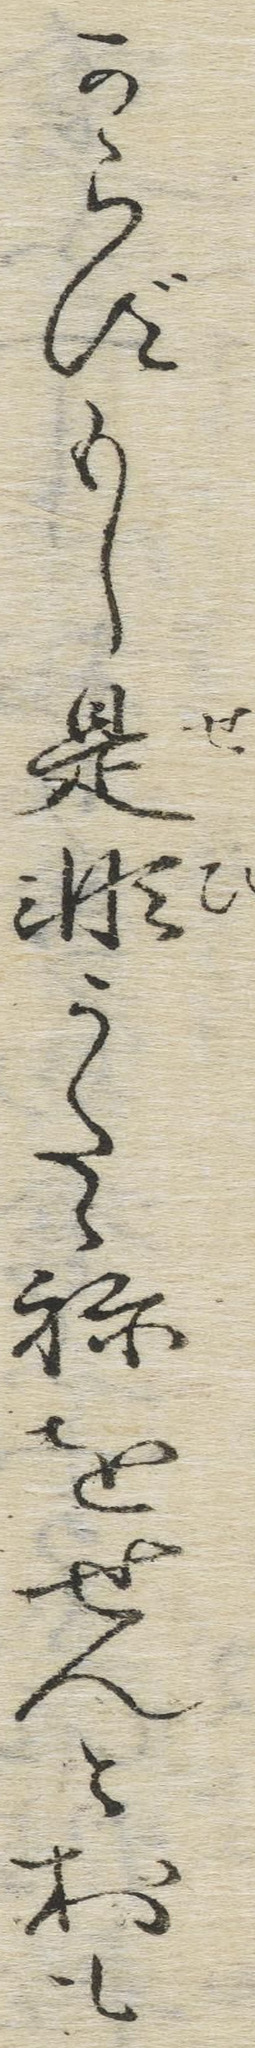からずもし是非うたゝねをせんとおも
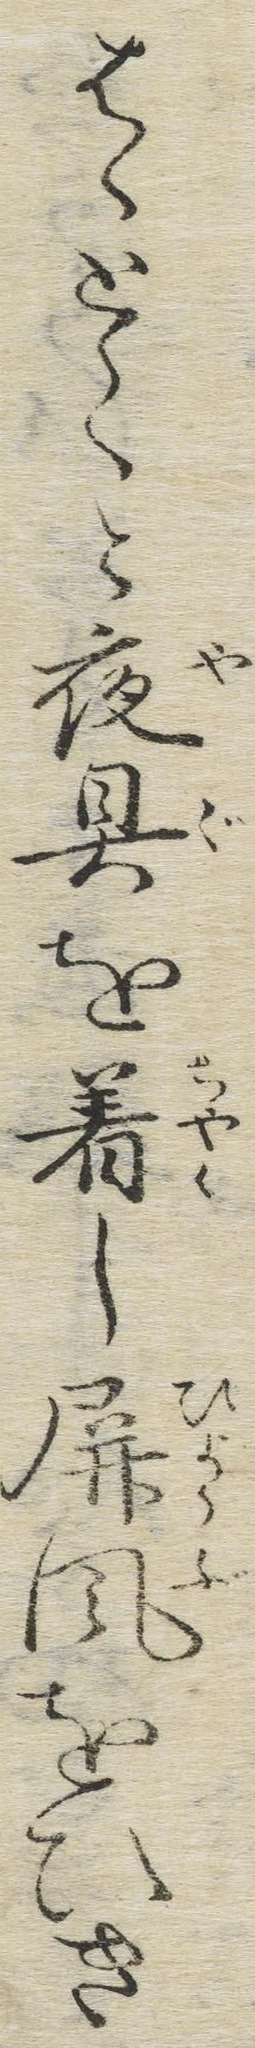はゝとくと夜具を着し屏風をひき
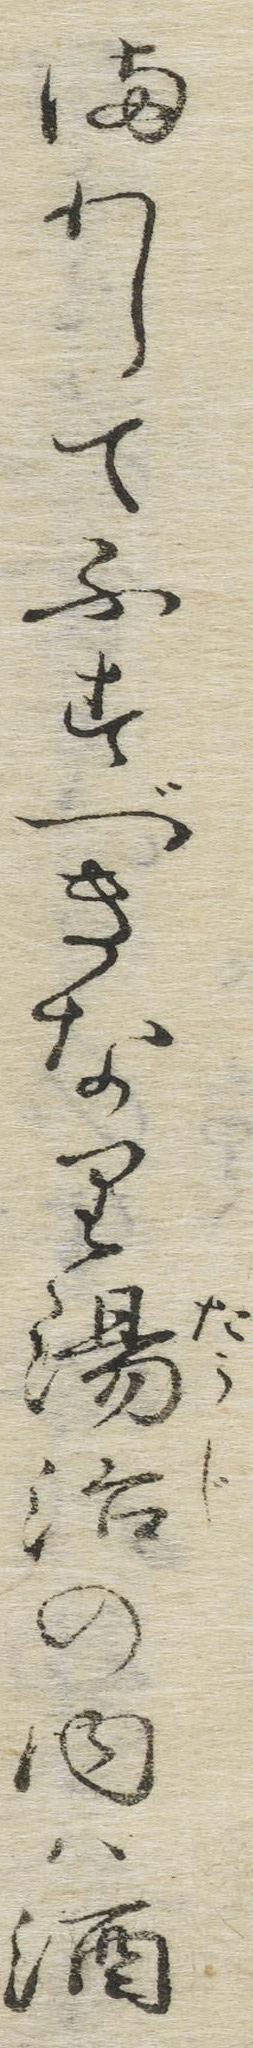まわしてふすべきなり湯治の内は酒
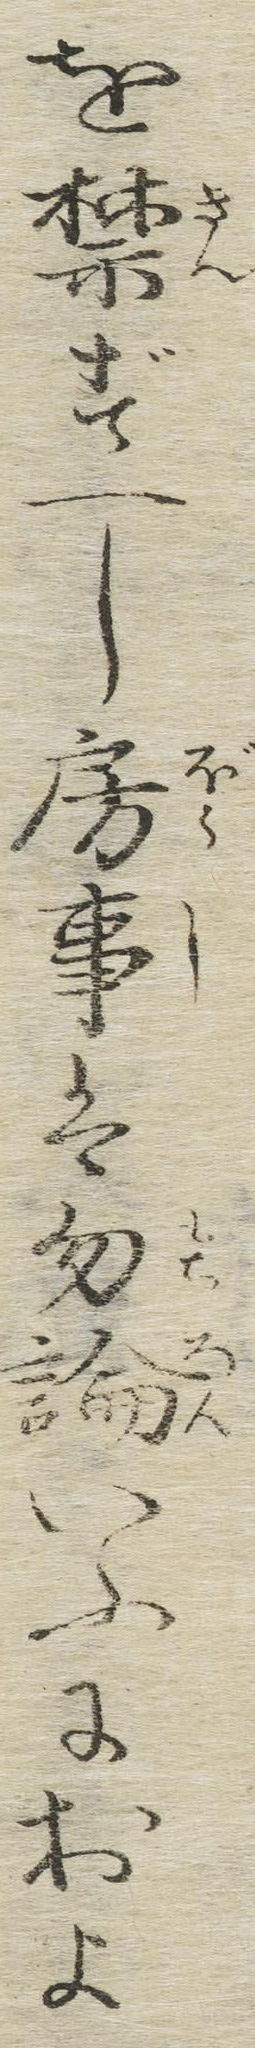を禁ずへし房事は勿論いふにおよ
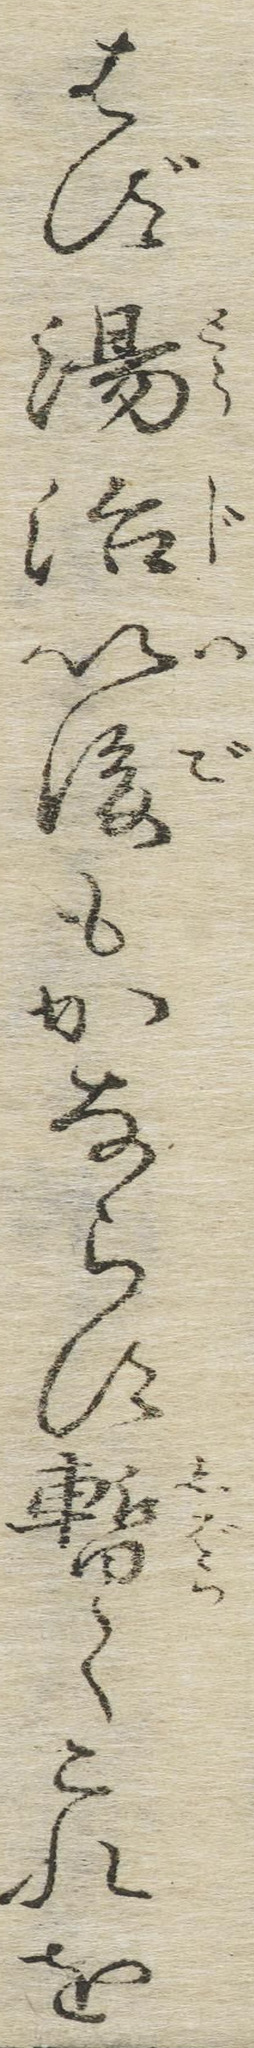はず湯治以後もかならす暫くこれを

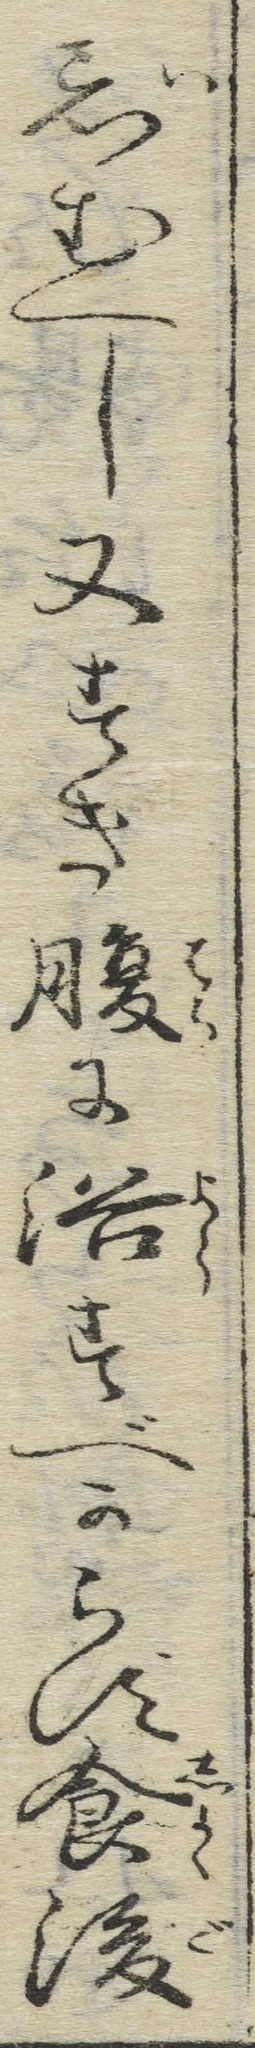忌むへし又すき腹に浴すべからす食後
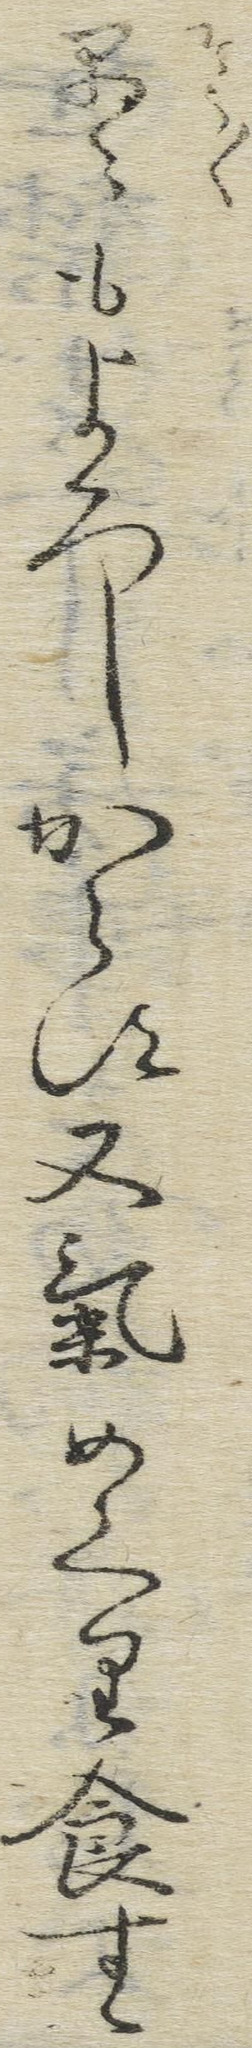早々もよろしからす又気めくり食すゝ
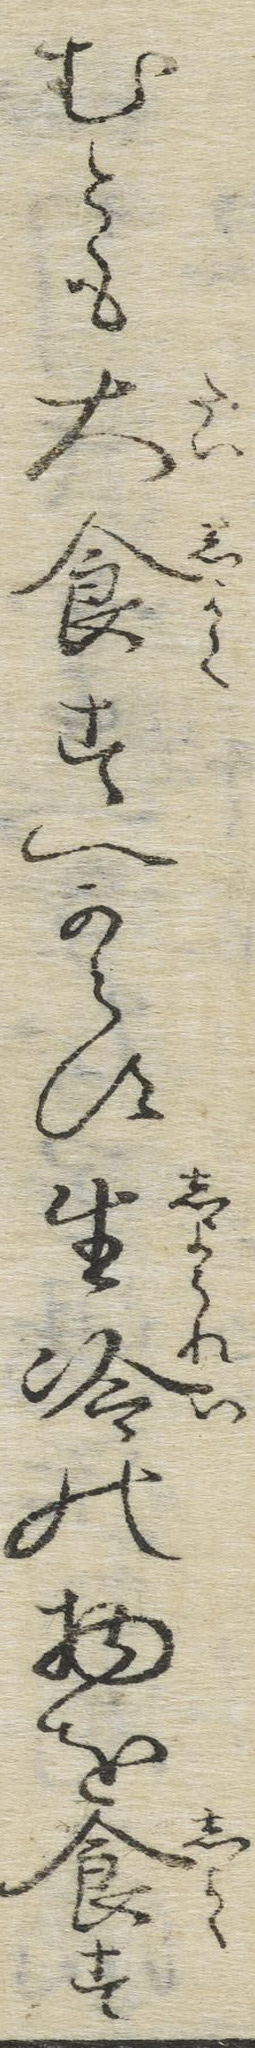むとも大食すへからす生冷の物を食す
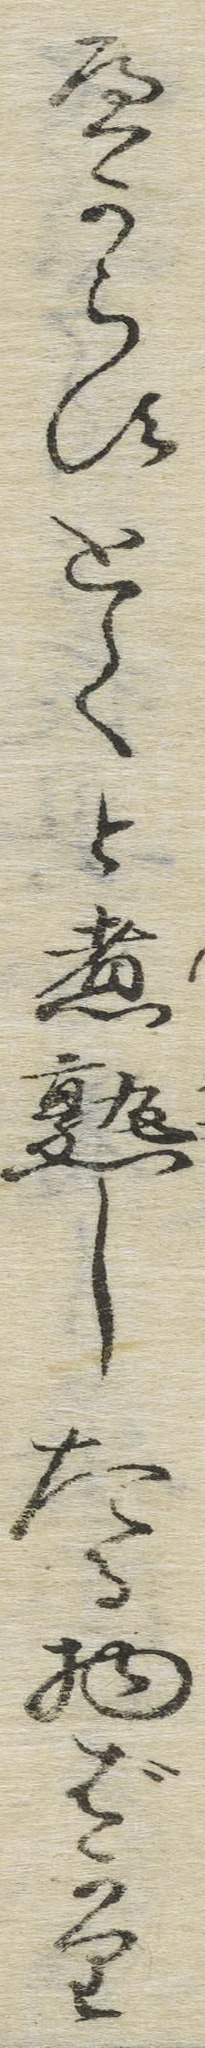へからすとくと煮熟したる物ばかり
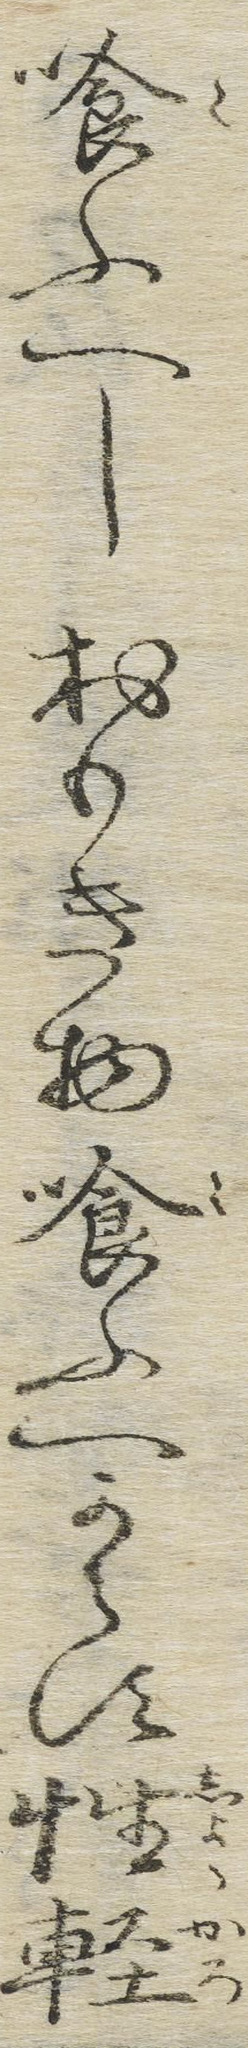食ふへしおもき物食ふへからす性軽
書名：温泉考
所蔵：東京大学地震研究所図書室 Earthquake Research Institute Library, The University of Tokyo, JAPAN
